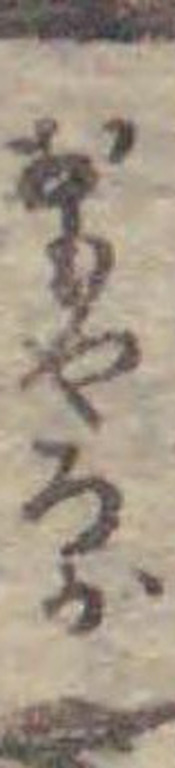おもやるか
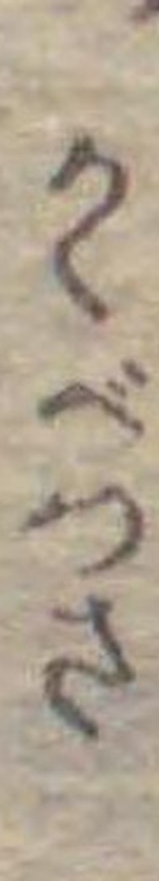かくべつさ

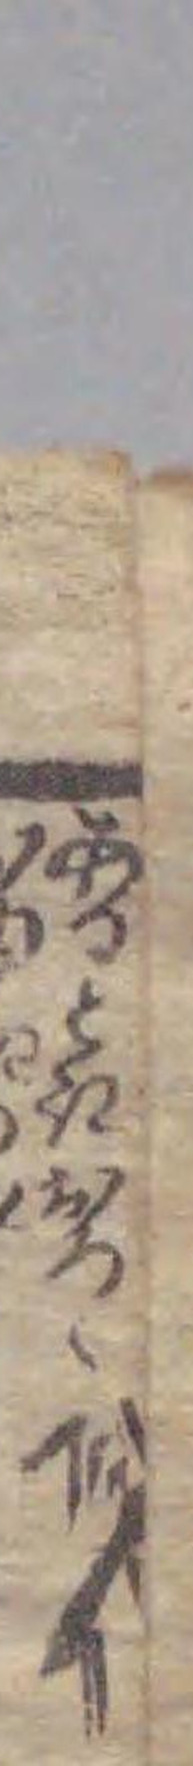あるときおろく
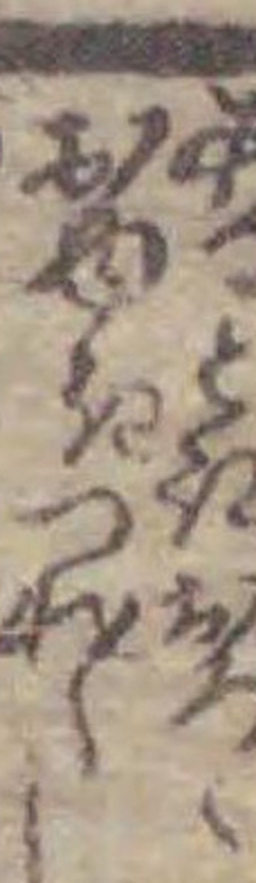おゆきつれ〳〵
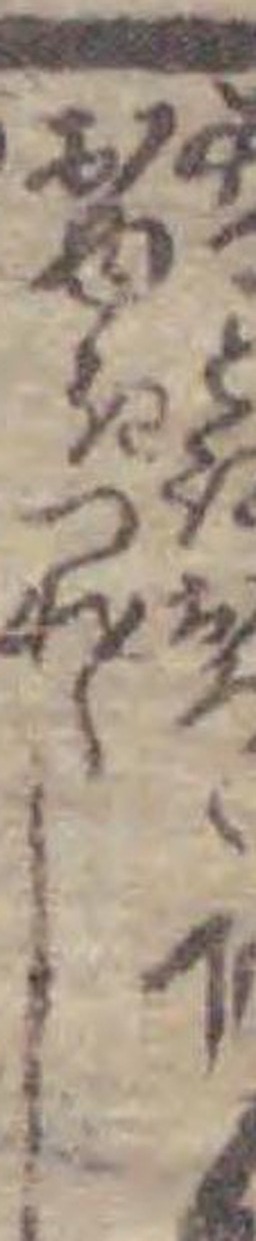おゆきつれ〳〵
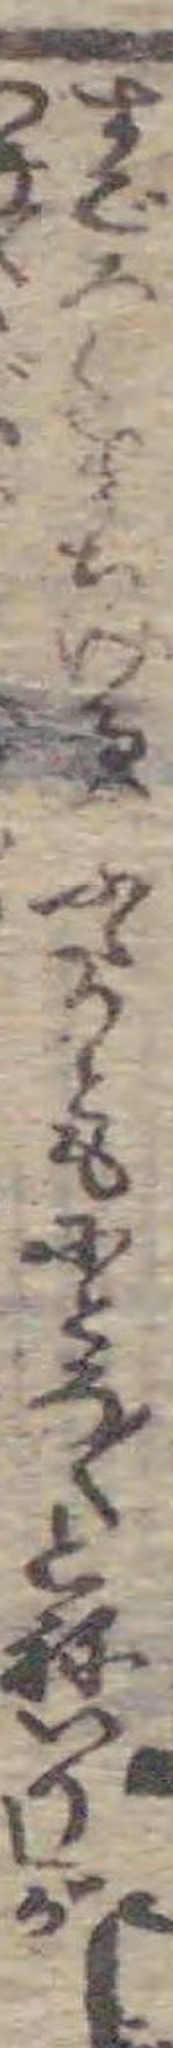のあまりすごろくをうちけるふたりともにとろ〳〵とねいりしが
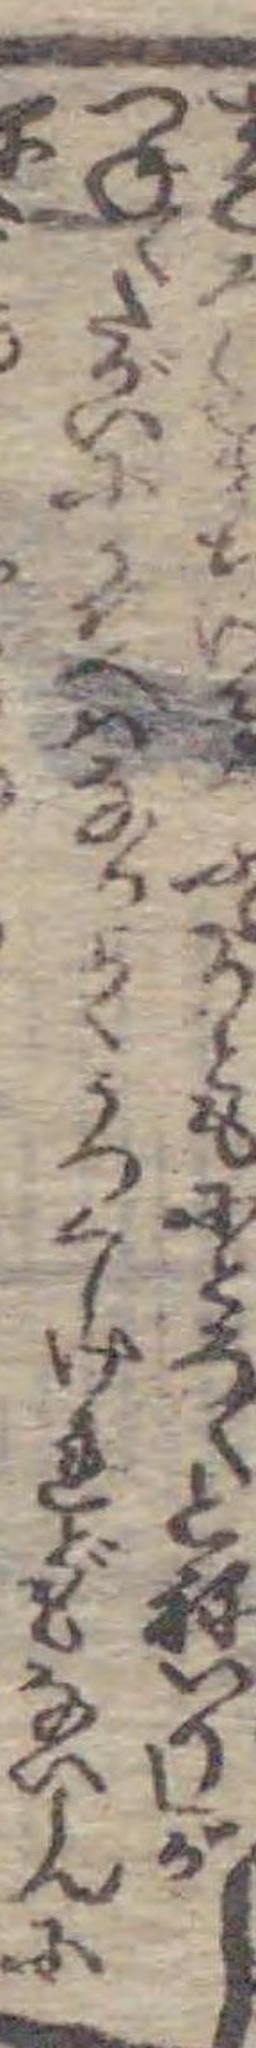つね〳〵たがいにかへはなかよくうつくしけれどもないしんに
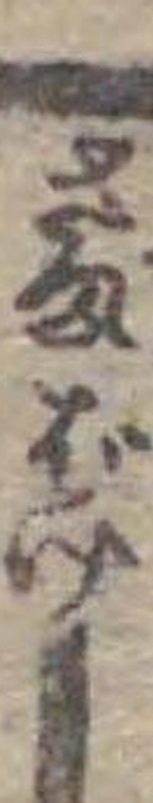さまばけ
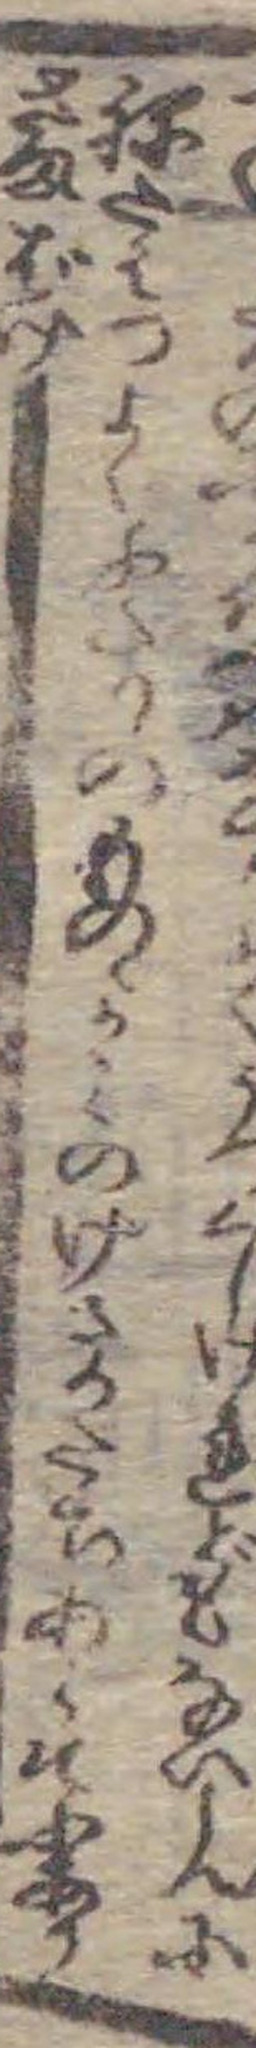ねたみつよくふたりのものゝかみのけさかたちあらそふあり
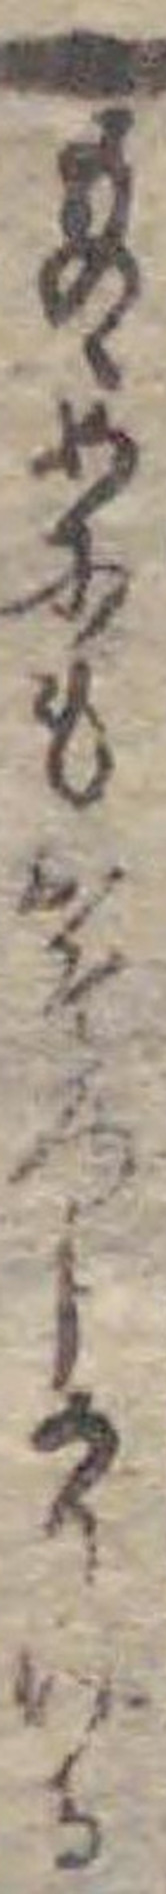ものゝめにもおそろしかりける
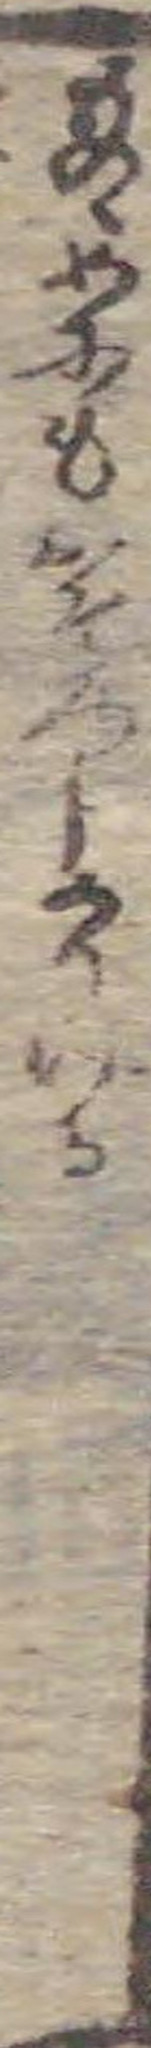ものゝめにもおそろしかりける
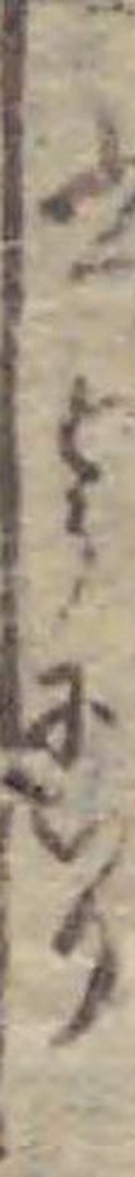ぶつどうにいり
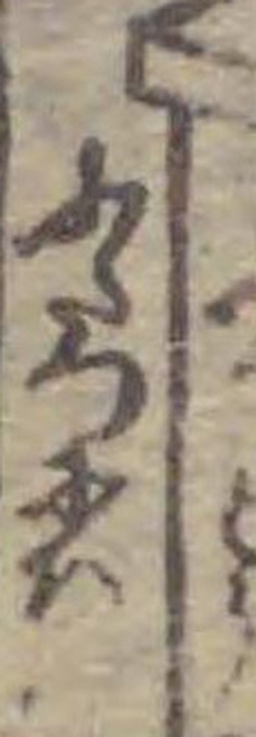ふたつには
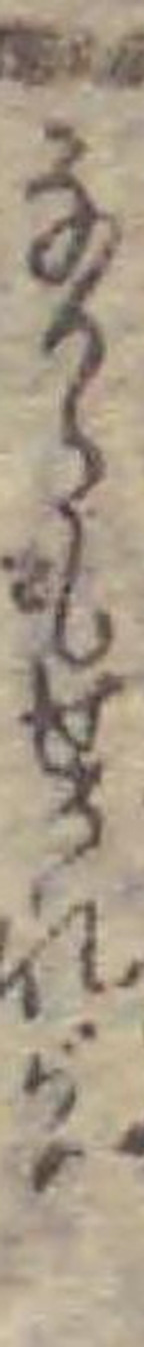なからもせがれが
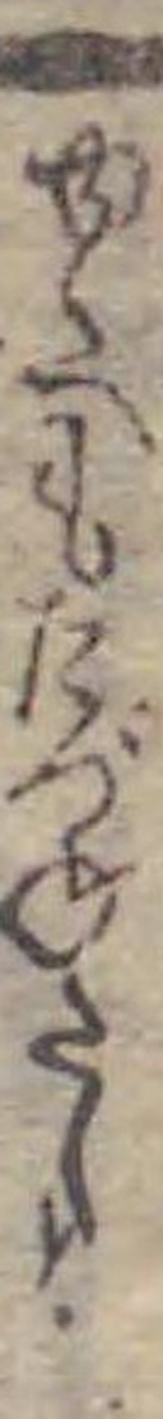ゆくへもたづねたしと
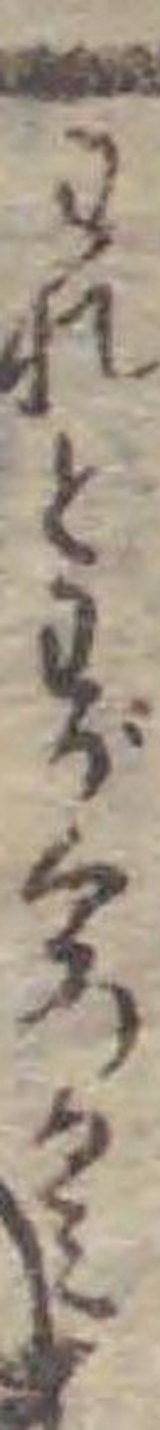われとわがくろかみ
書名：[化物一代記] : 5巻
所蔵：国立国会図書館 National Diet Library, JAPAN
